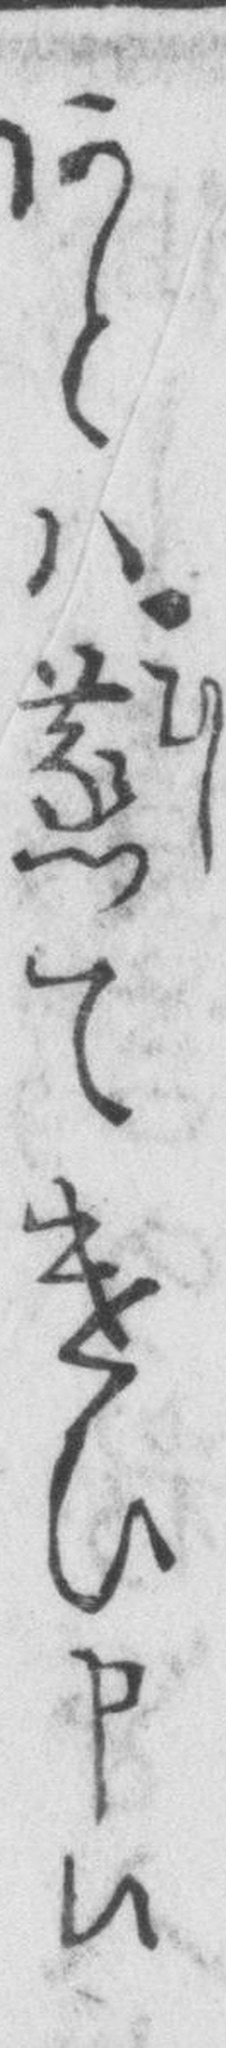あとは。蒸て遣ひ申候
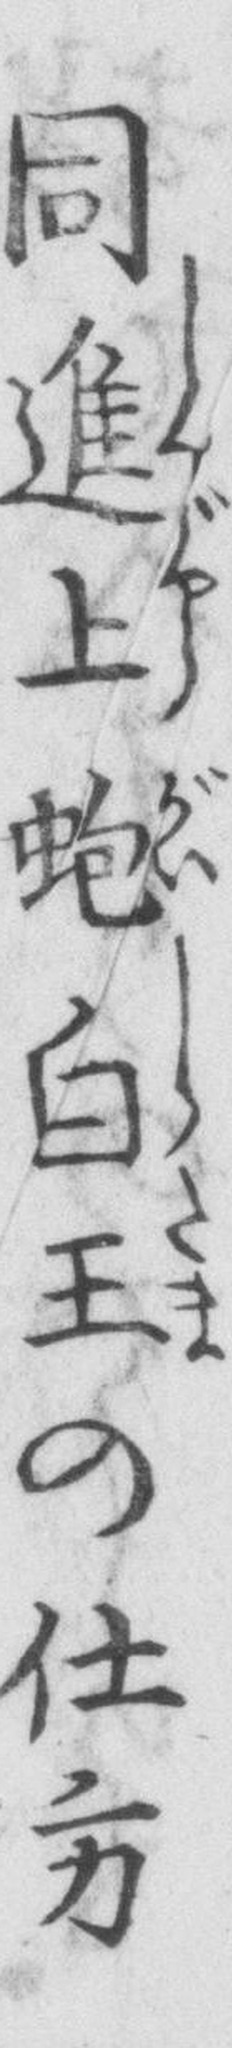同進上鮑白玉の仕方
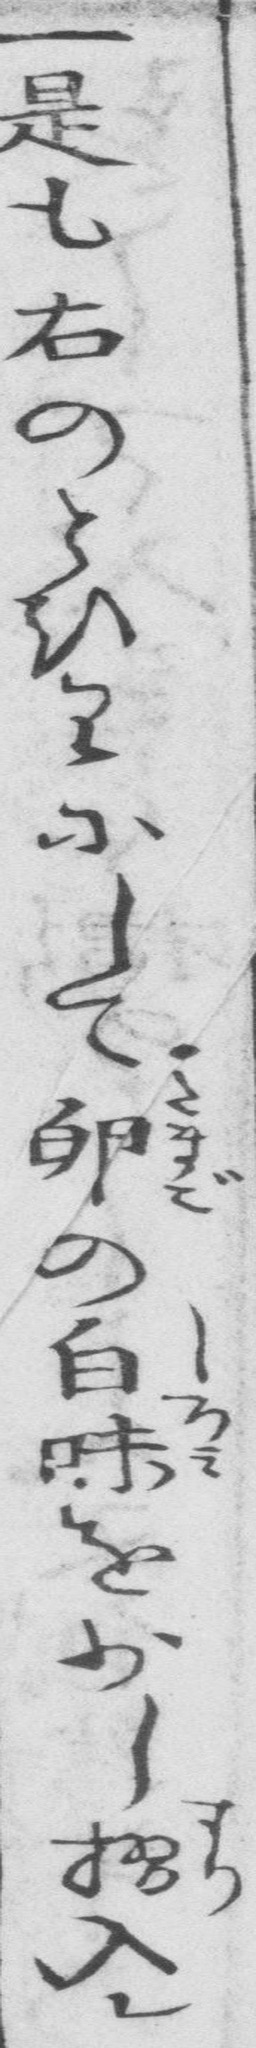一是も右のとをりにして。卵の白味を少し摺入れ
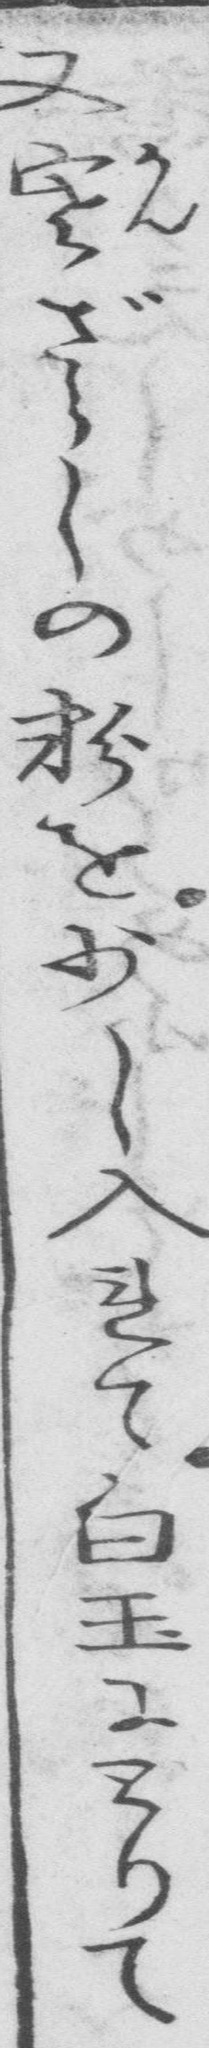又寒ざらしの粉を。少し入れて。白玉にとりて
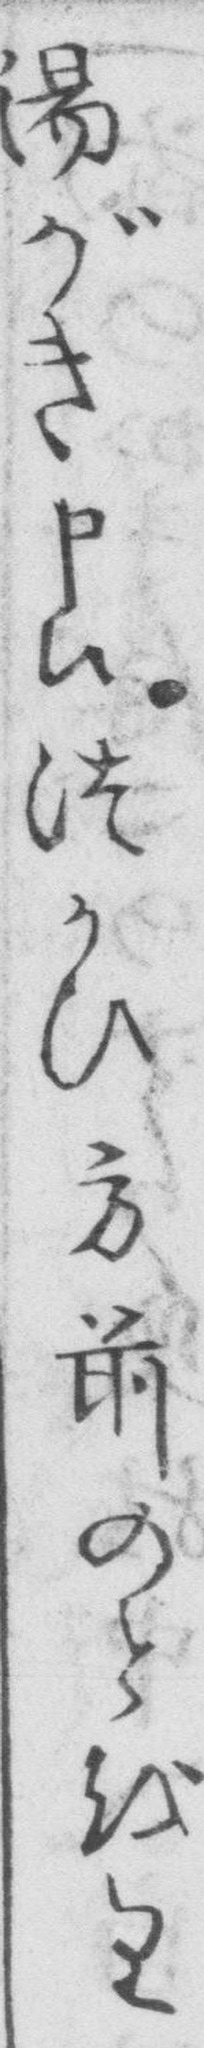湯がき申候。つかひ方前のとをり
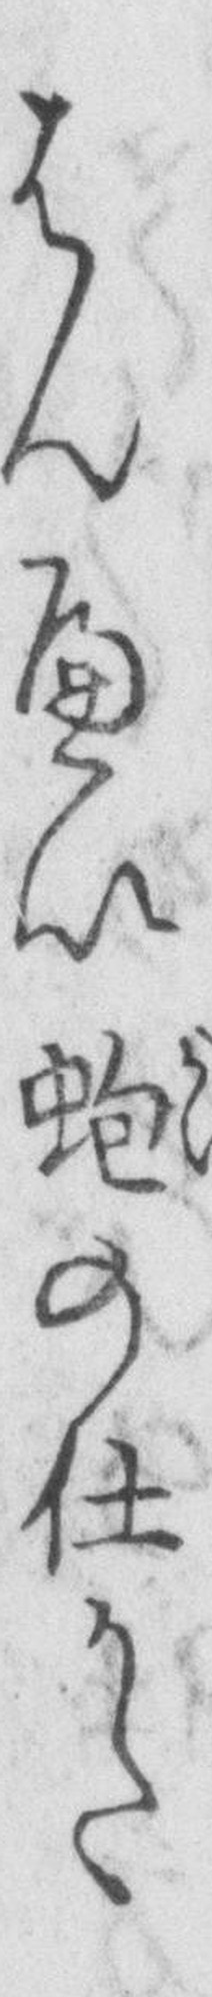はんへい鮑の仕かた
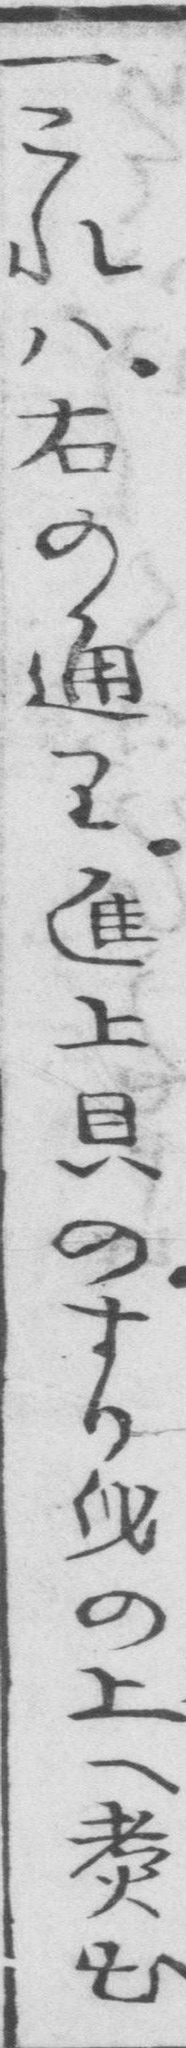一これは。右の通り。進上貝の。すり身の上へ煮出
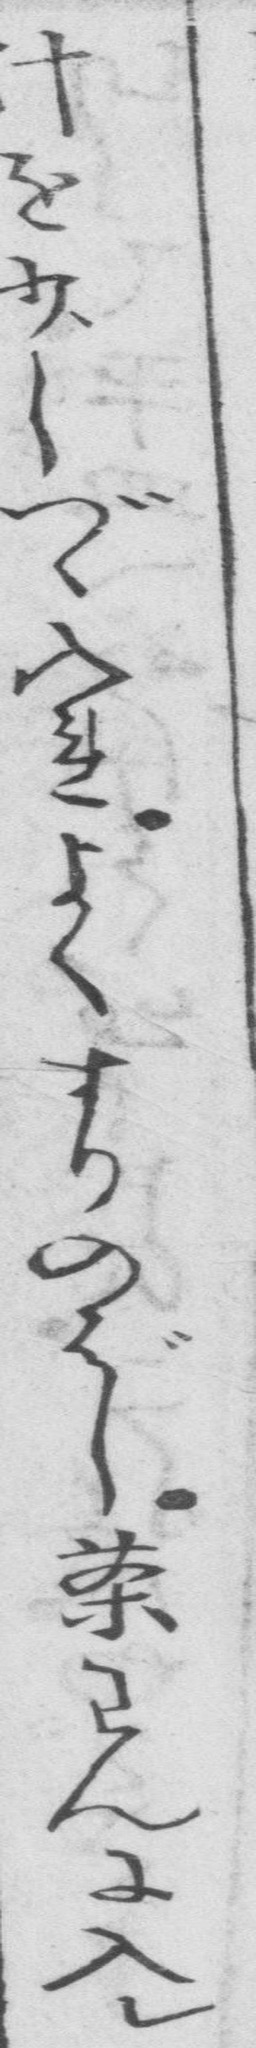汁を少しづゝ入れ。よくすりのばし。茶わんに入れ

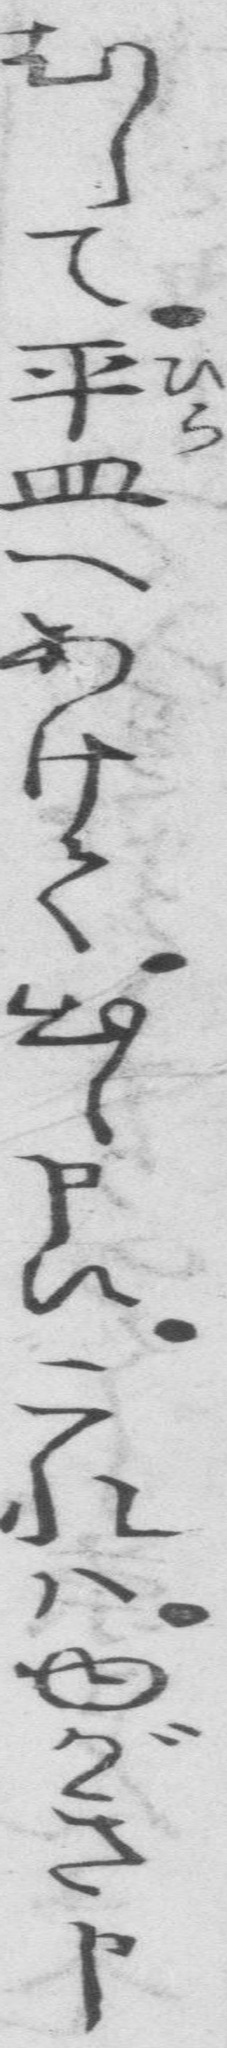むして。平皿へあけて。出し申候。これは。ゆがき申
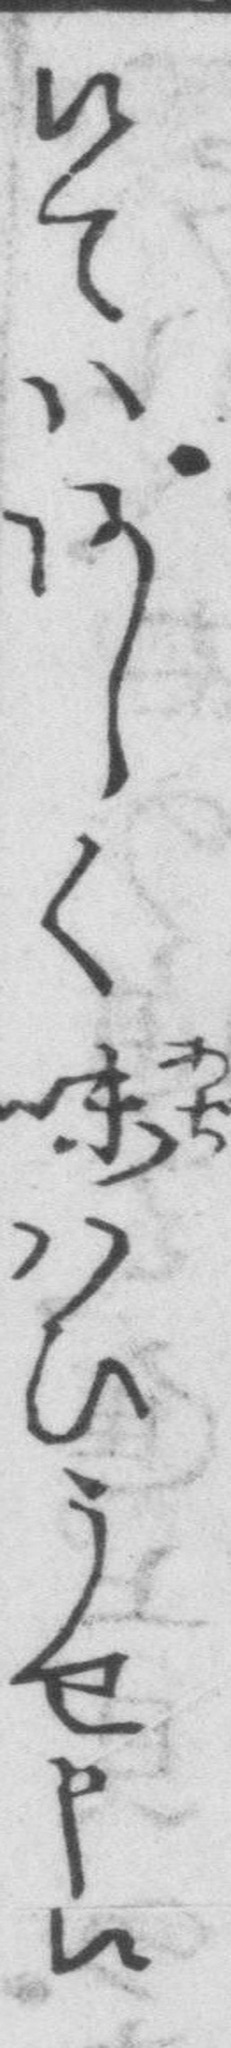候ては。あしく味はひうせ申候
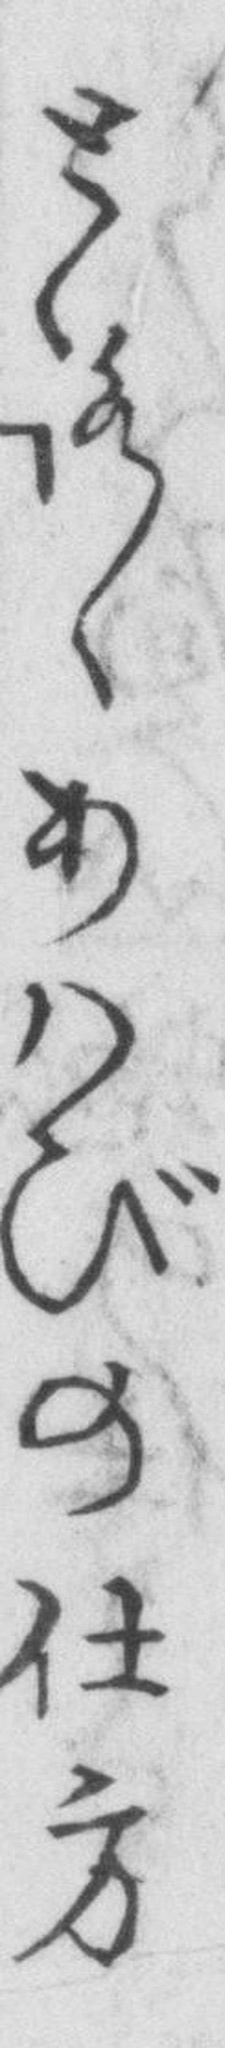とろゝあはびの仕方
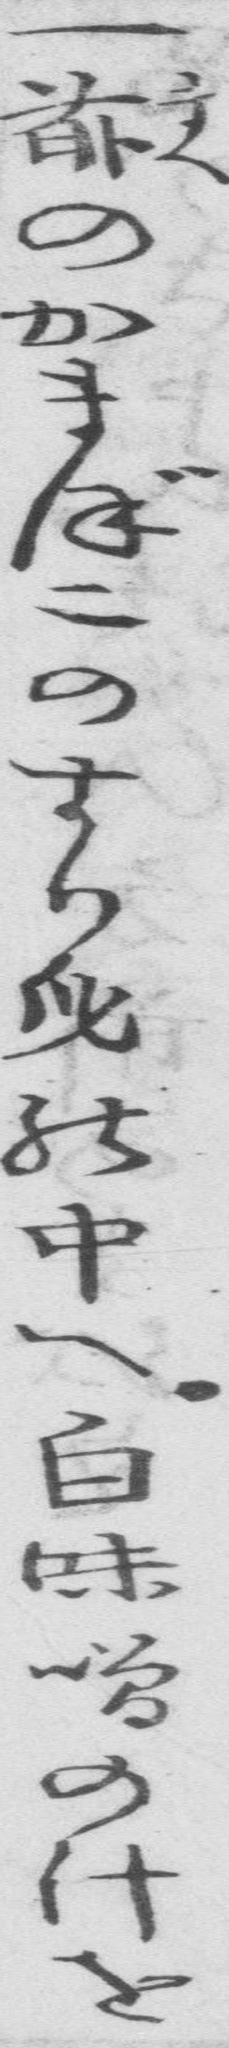一前のかまぼこのすり身の中へ。白味噌の汁を
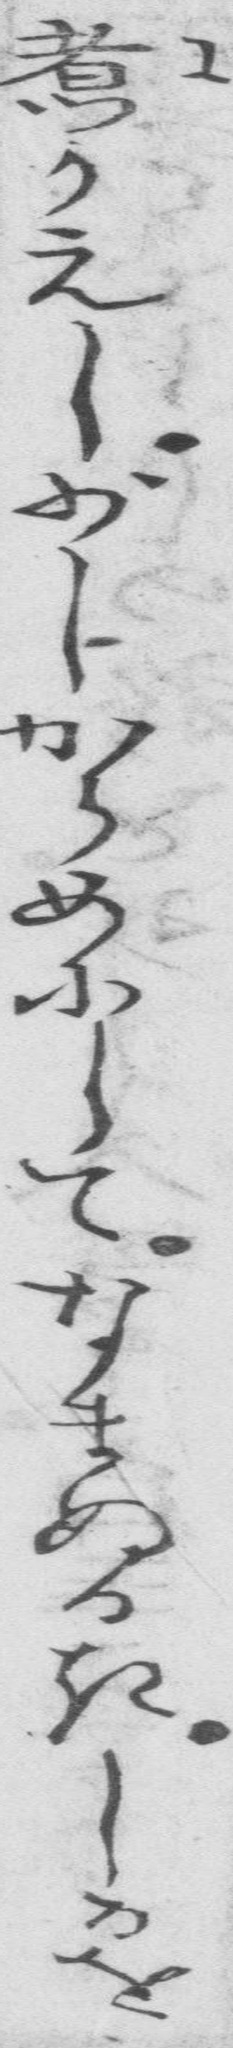煮かえし。少しからめにして。なまぬるき。しるを
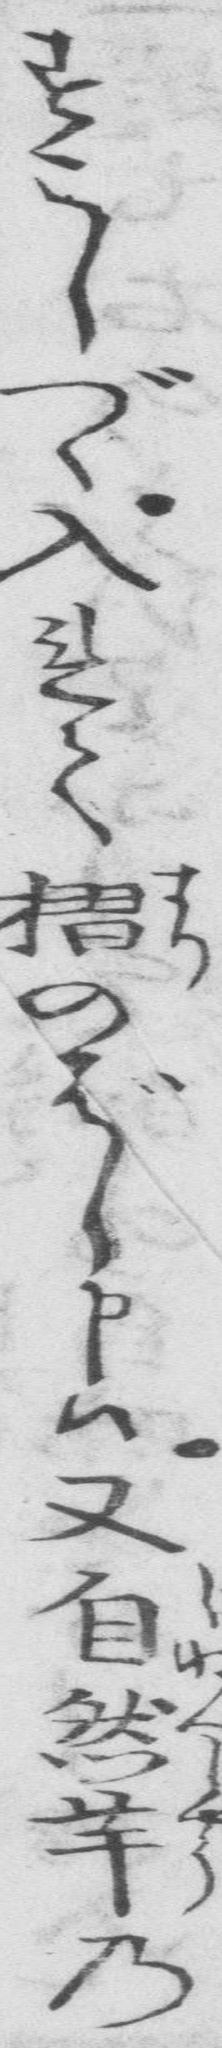すこしづゝ。入れて摺のばし申候。又自然芋の
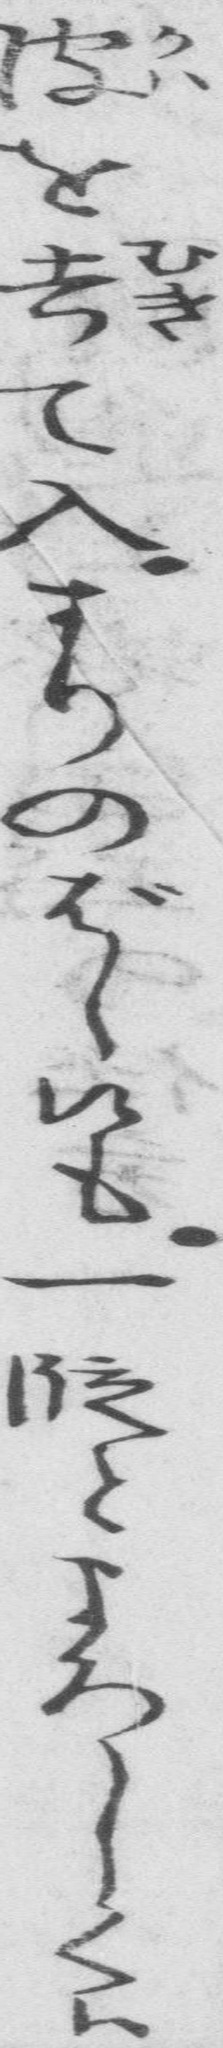皮を去て入。すりのばし候も。一段とよろしく候
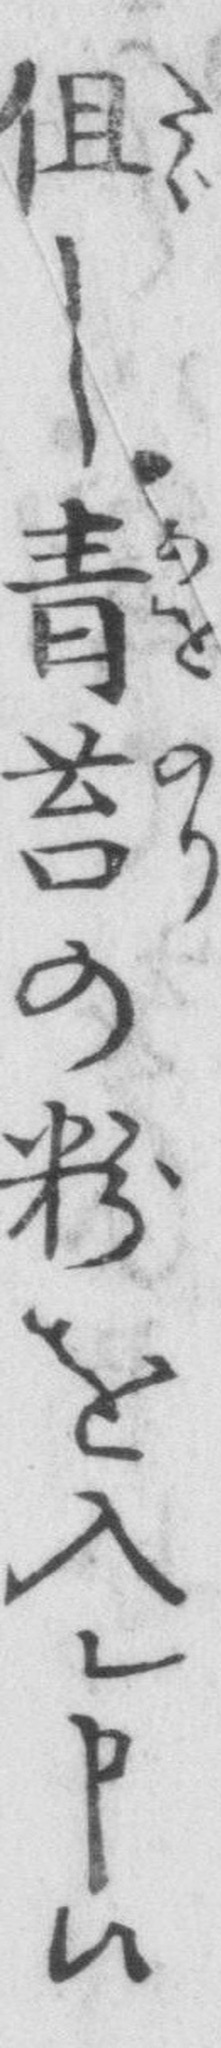但し。青苔の粉を入れ申候
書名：萬寳料理秘密箱
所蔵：大阪府立大学学術情報センター 国文学研究資料館
